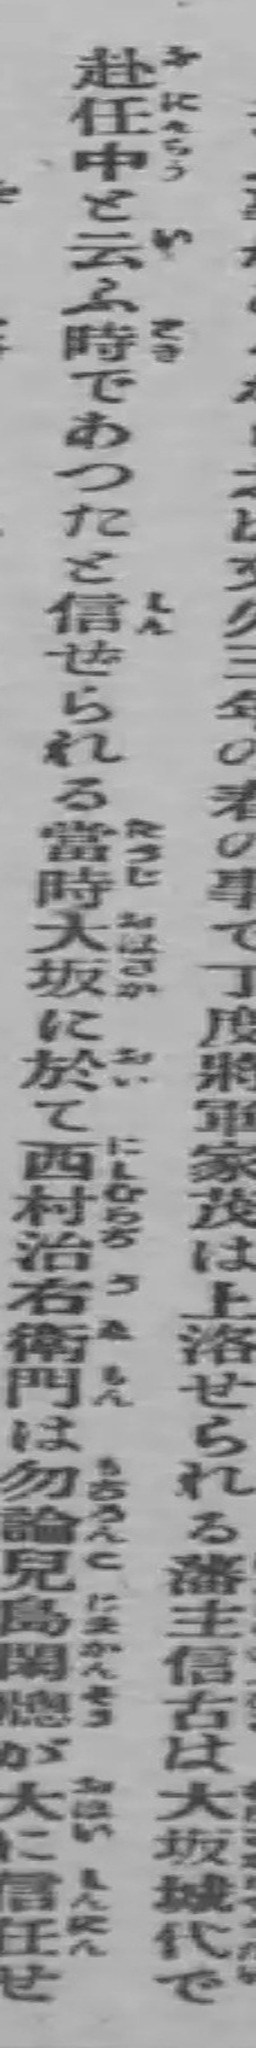赴任中と云ふ時であつたと信ぜられる当時大坂に於て西村治右衛門は勿論児島閑牕が大に信任せ
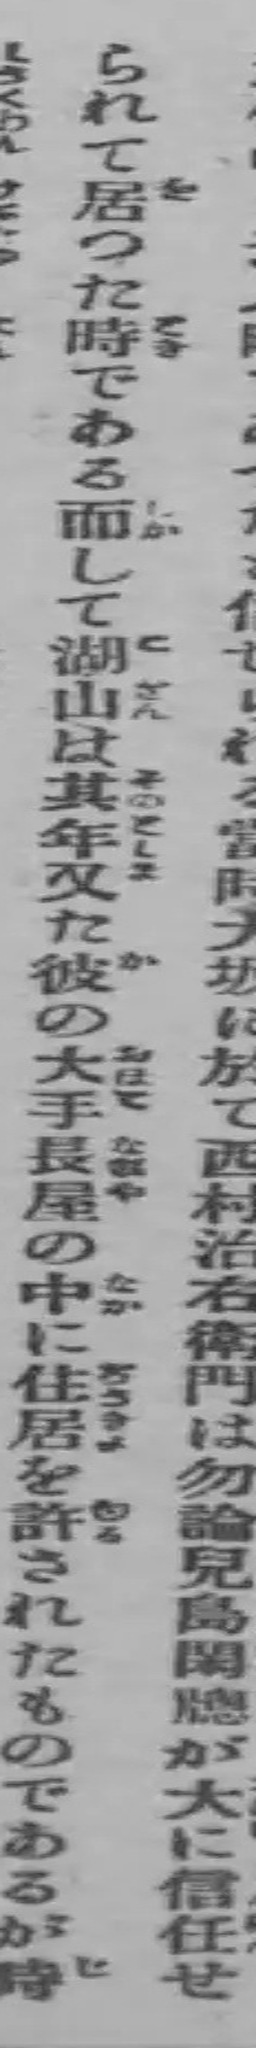られて居つた時である而して湖山は其年又た彼の大手長屋の中に住居を許されたものであるが時
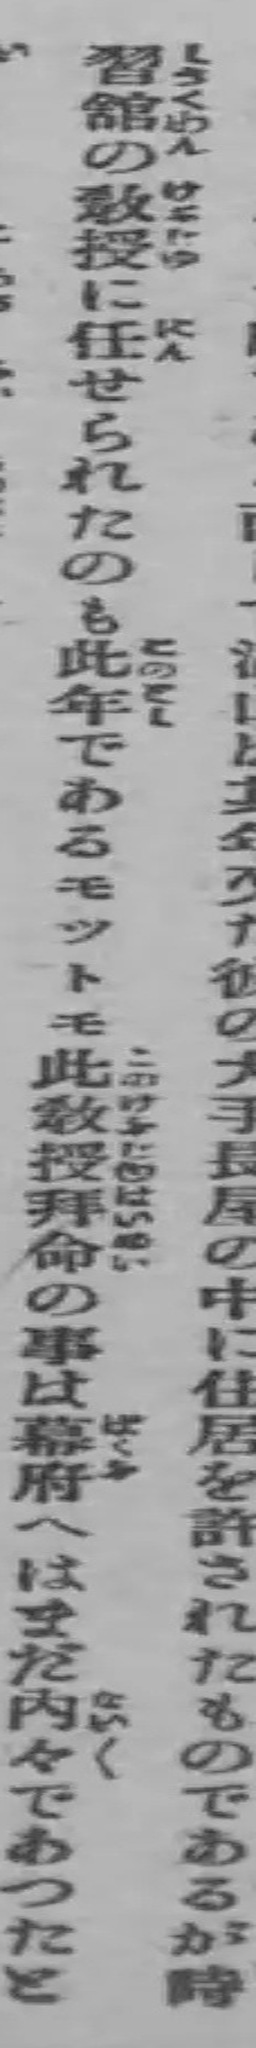習館の教授に任せられたのも此年であるモツトモ此教授拝命の事は幕府へはまだ内々であつたと
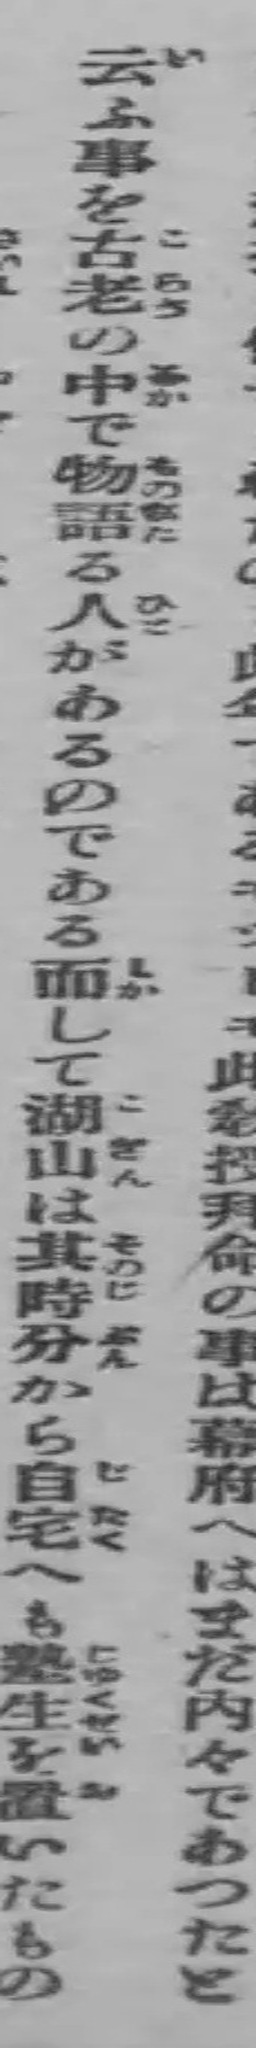云ふ事を古老の中で物語る人があるのである而して湖山は其時分から自宅へも塾生を置いたもの
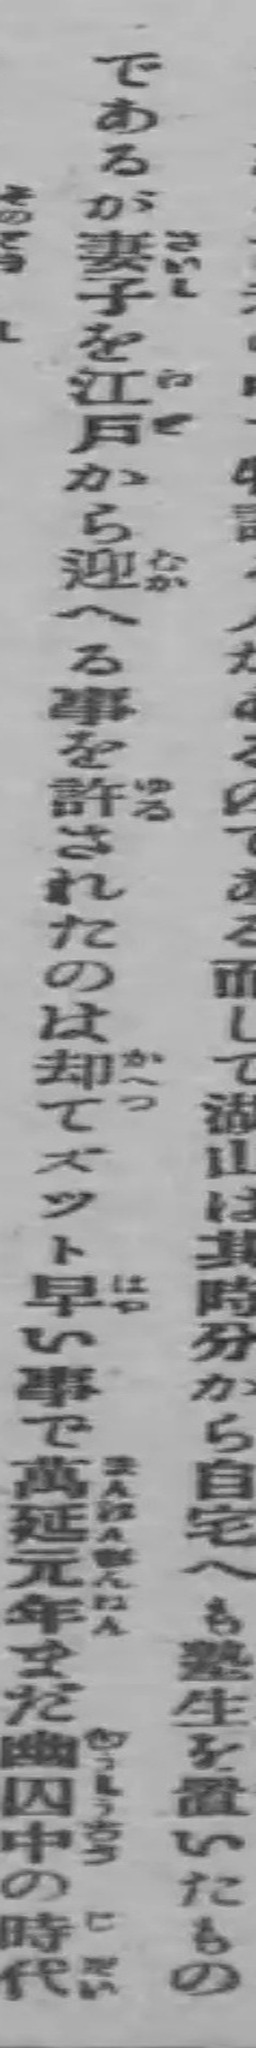であるが妻子を江戸から迎へる事を許されたのは却てズツト早い事で万延元年まだ幽囚中の時代
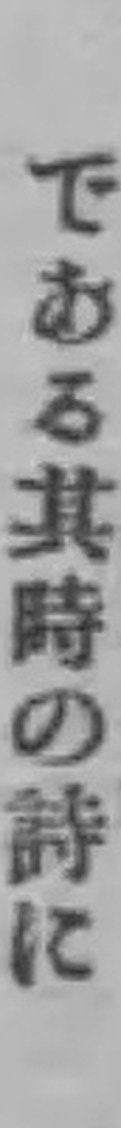である其時の詩に
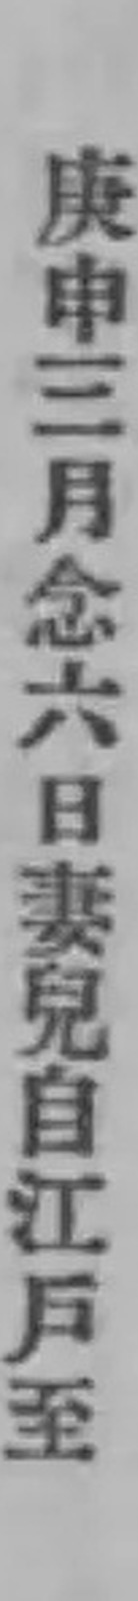庚申三月念六日妻児自江戸至
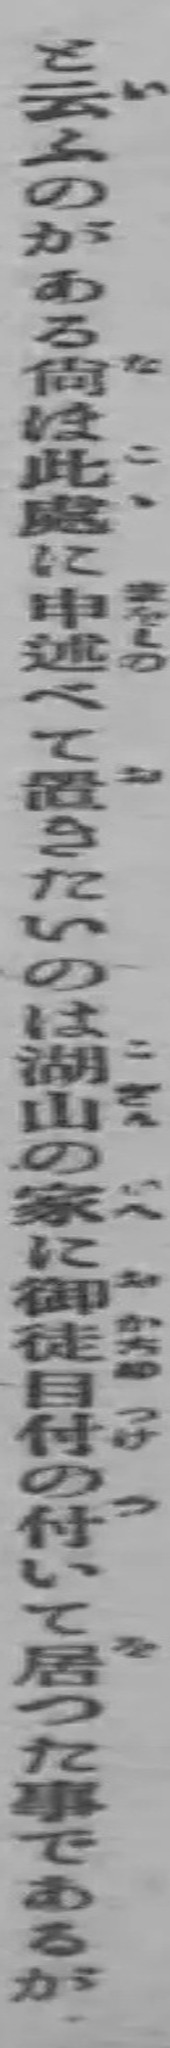と云ふのがある尚ほ此処にも申述べて置きたいのは湖山の家に御徒目付の付いて居つた事であるが
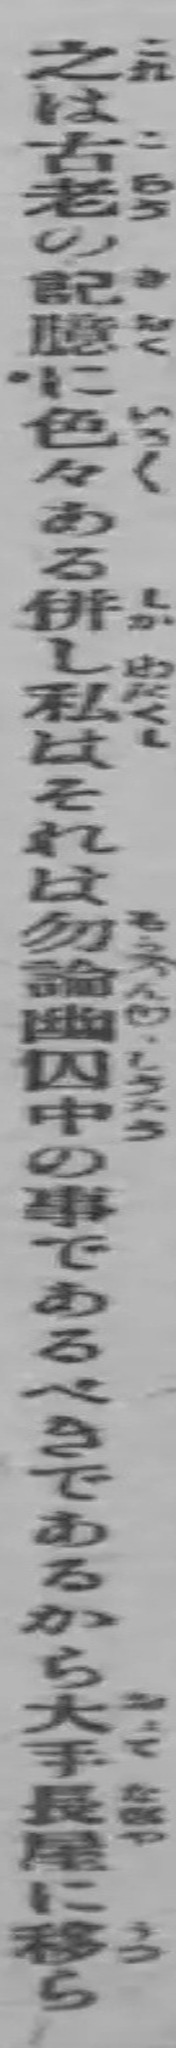之は古老の記憶に色々ある併し私はそれは勿論幽囚中の事であるべきであるから大手長屋に移ら
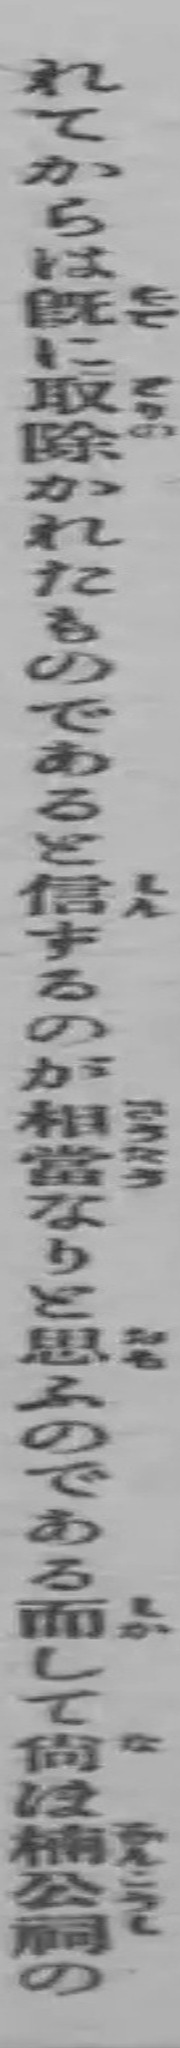れてからは既に取除かれたものであると信ずるのが相当なりと思ふのである而して尚ほ楠公祠の
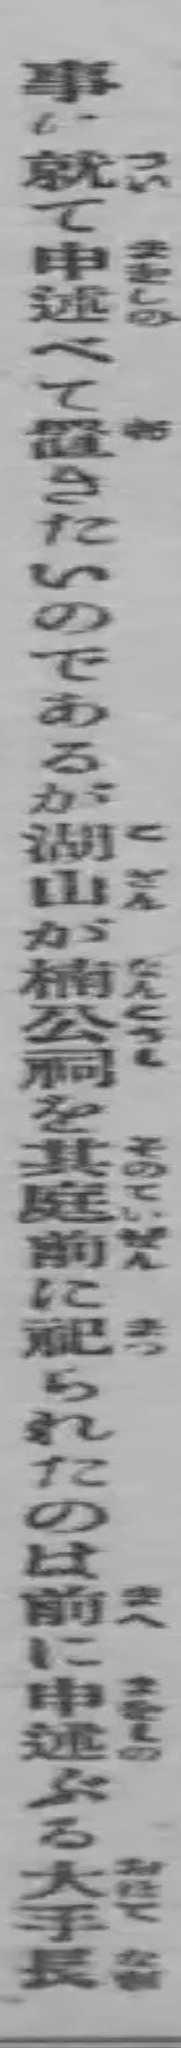事に就て申述べて置きたいのであるが湖山が楠公祠を其庭前に祀られたのは前に申述ぶる大手長
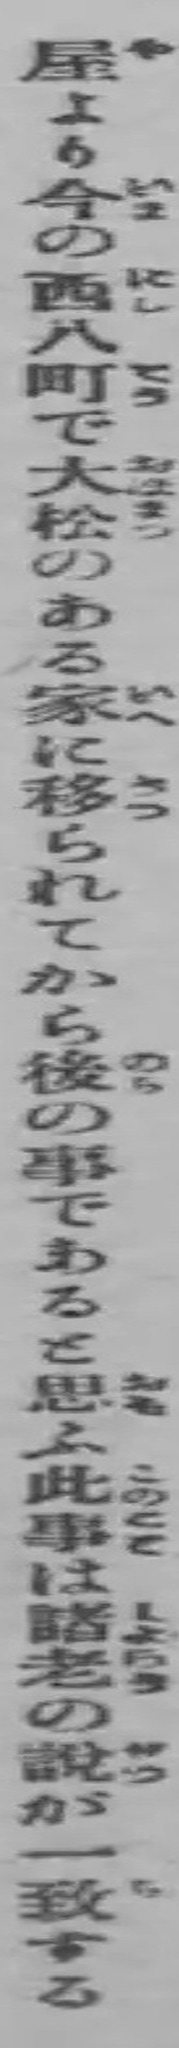屋より今の西八町で大松のある家に移られてから後の事であると思ふ此事は諸老の説が一致する
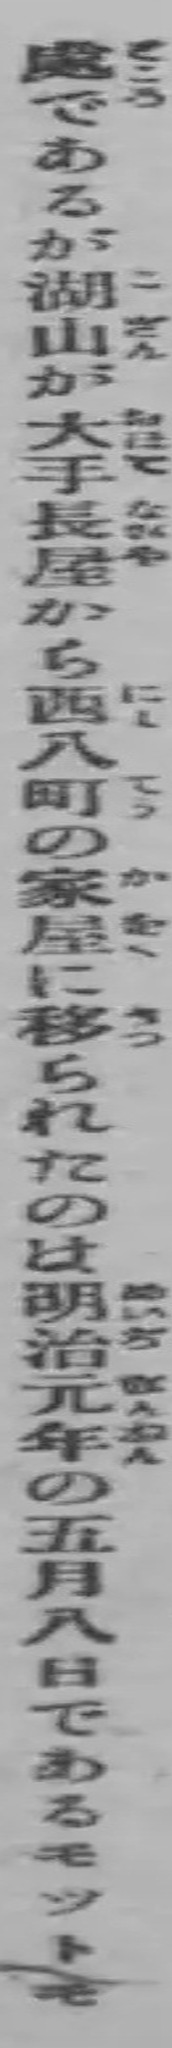処であるが湖山が大手長屋から西八町の家屋に移られたのは明治元年の五月八日であるモツトモ
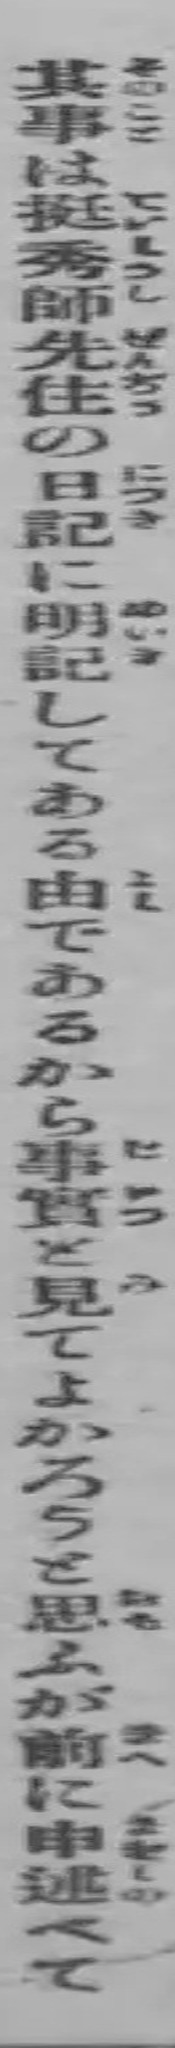其事は挺秀師先住の日記に明記してある由であるから事実と見てよかろうと思ふが前に申述べて
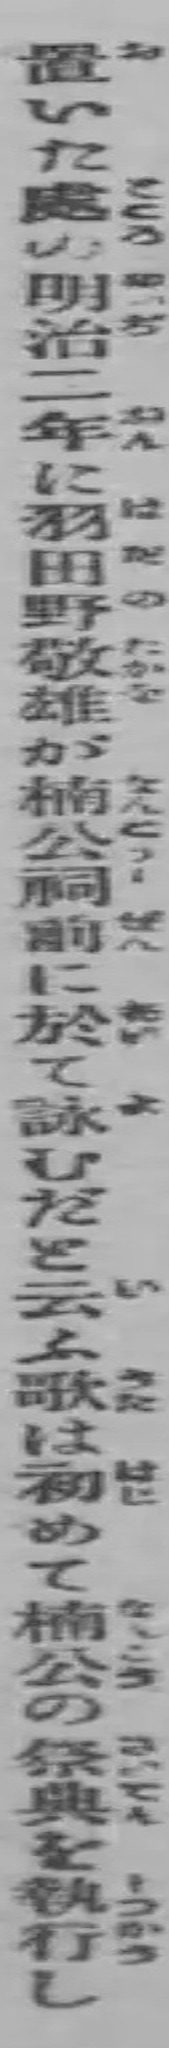置いた処の明治二年の羽田野敬雄が楠公祠前に於て詠むだと云ふ歌は初めて楠公の祭典を執行し
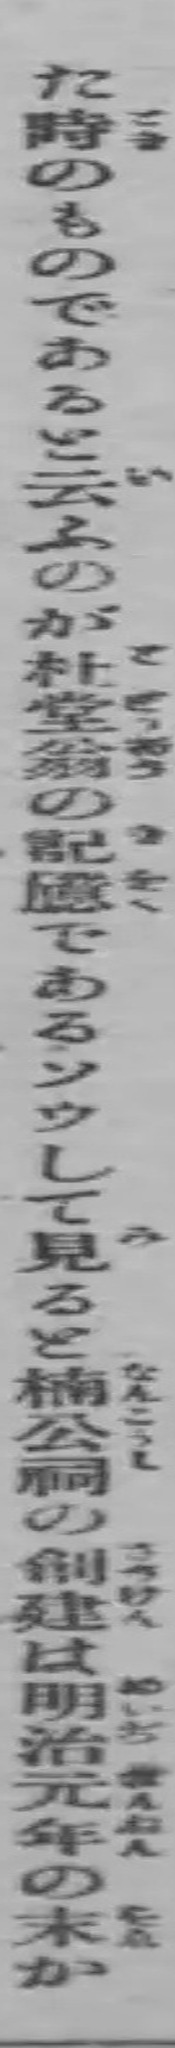た時のものであると云ふのが杜堂翁の記憶であるソウして見ると楠公祠の創建は明治元年の末か
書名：豊橋市史談
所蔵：国立国会図書館 National Diet Library, JAPAN
